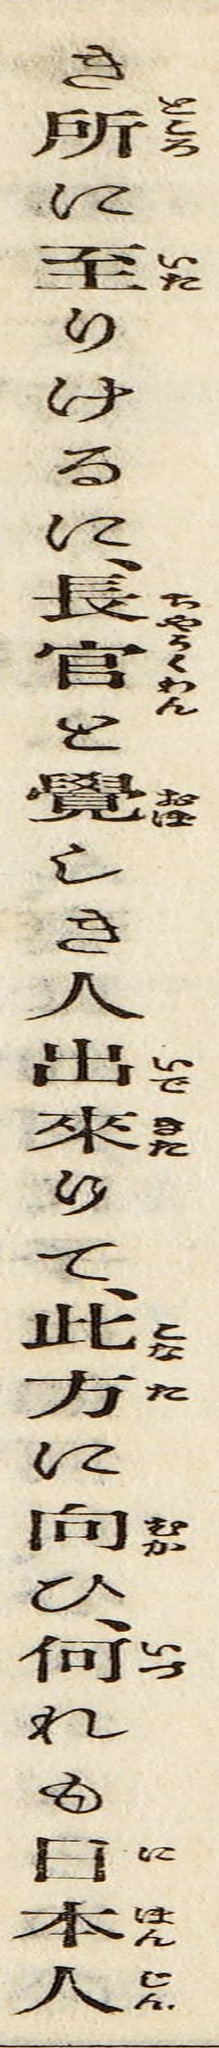き所に至りけるに、長官と覚しき人出来りて、此方に向ひ、何れも日本人
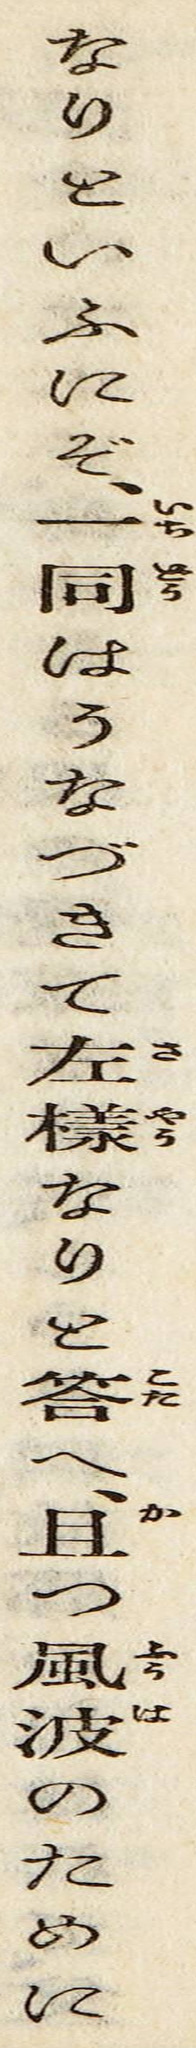なりといふにぞ、一同はうなづきて左様なりと答へ、且つ風波のために
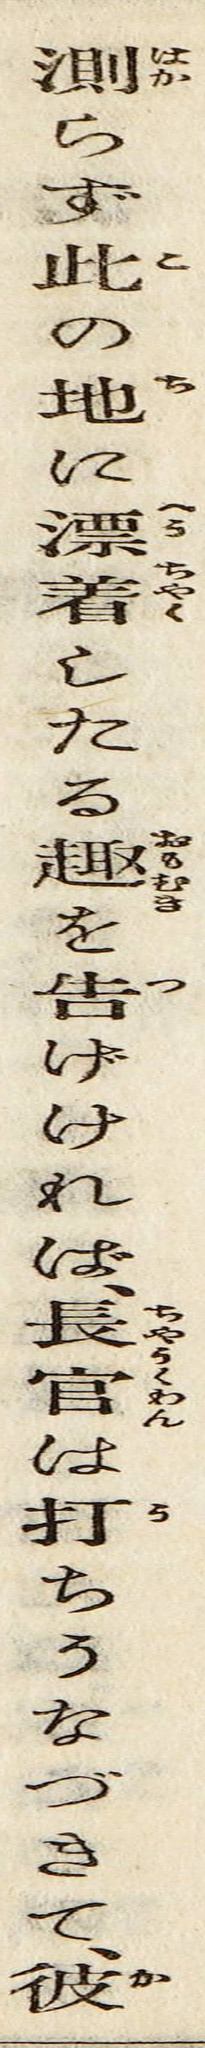測らず此の地に漂着したる趣を告げければ、長官は打ちうなづきて、彼
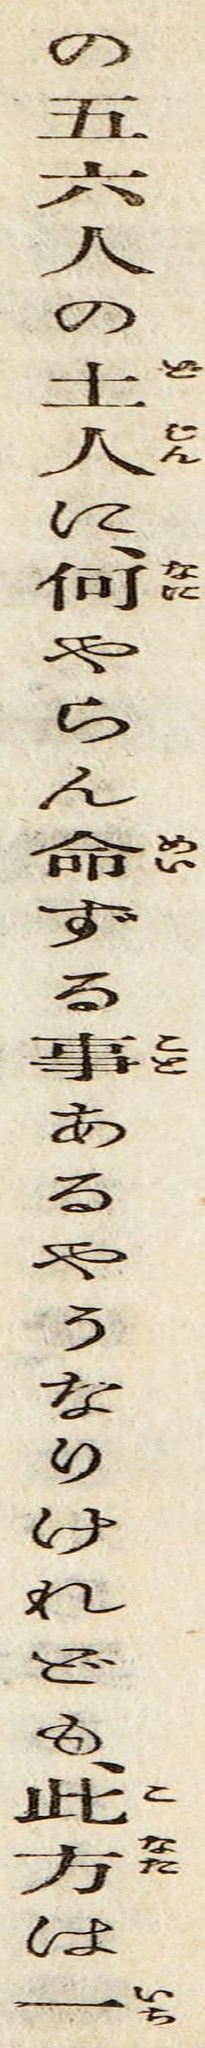の五六人の土人に、何やらん命ずる事あるやうなりけれども、此方は一
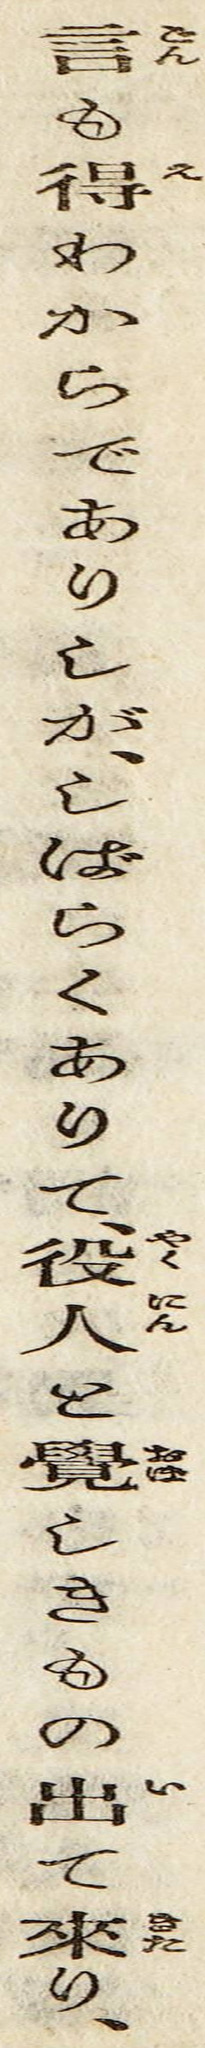言も得わからでありしが、しばらくありて、役人と覚しきもの出て来り、
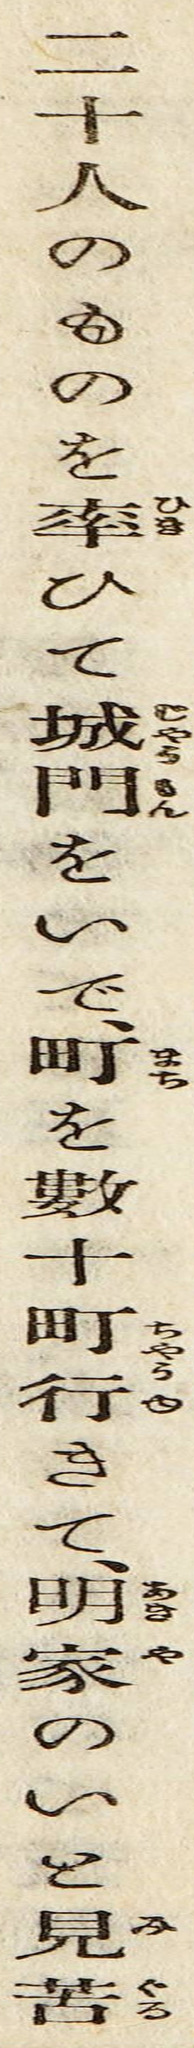二十人のものを率ひて城門をいで、町を数十町行きて、明家のいと見苦
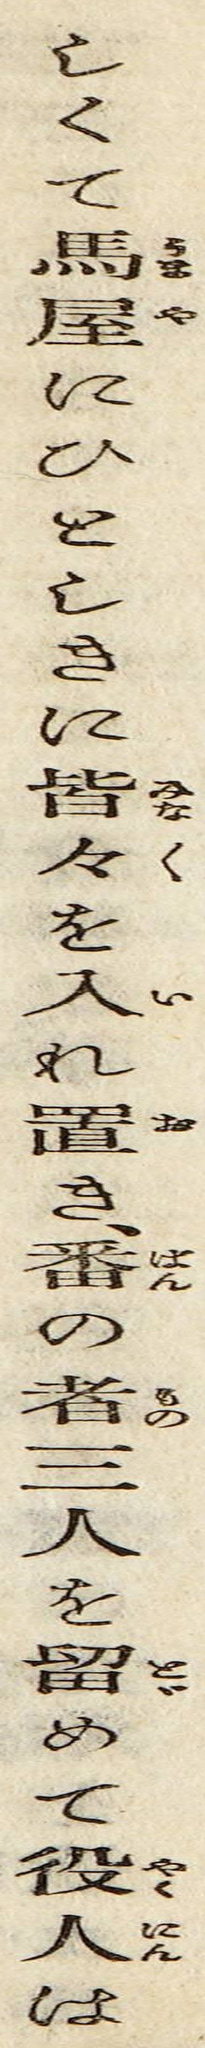しくて馬屋にひとしきに皆々を入れ置き、番の者三人を留めて役人は

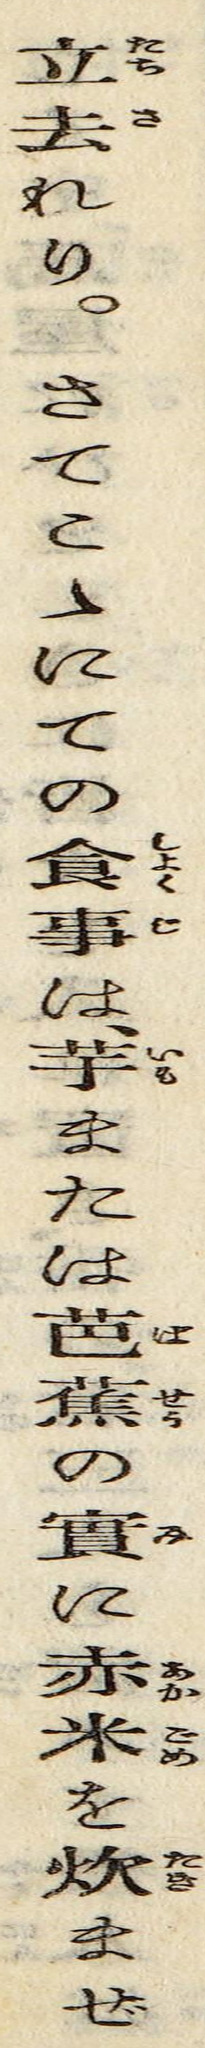立去れり。さてこゝにての食事は、芋または芭蕉の実に赤米を炊まぜ
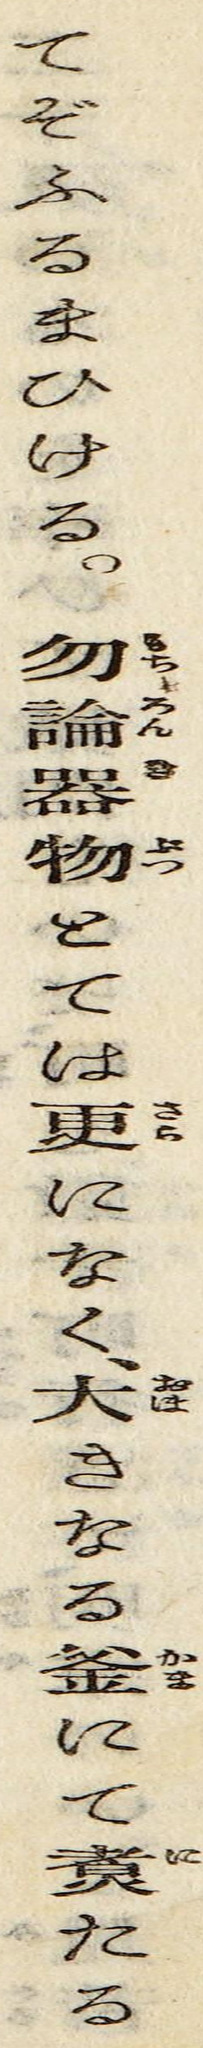てぞふるまひける。勿論器物とては更になく、大きなる釜にて煮たる
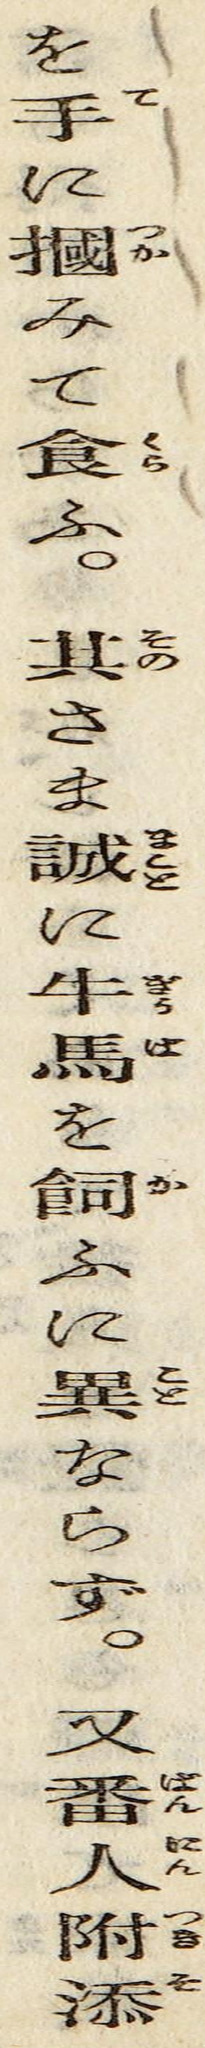を手に掴みて食ふ。其さま誠に牛馬を飼ふに異ならず。又番人附添
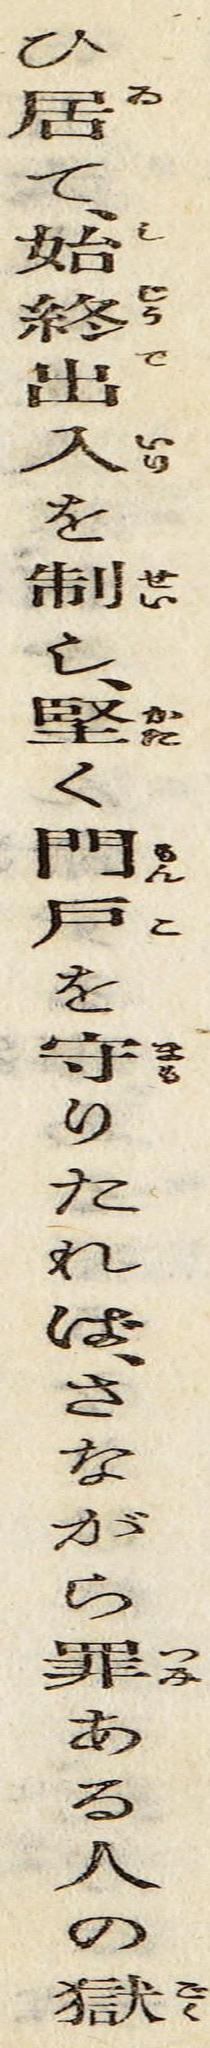ひ居て、始終出入を制し、堅く門戸を守りたれば、さながら罪ある人の獄
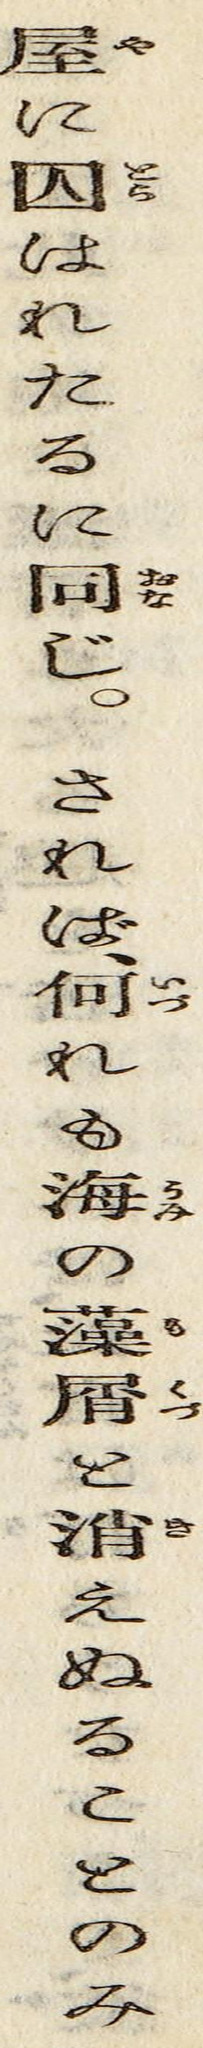屋に囚はれたるに同じ。されば、何れも海の藻屑と消えぬることのみ
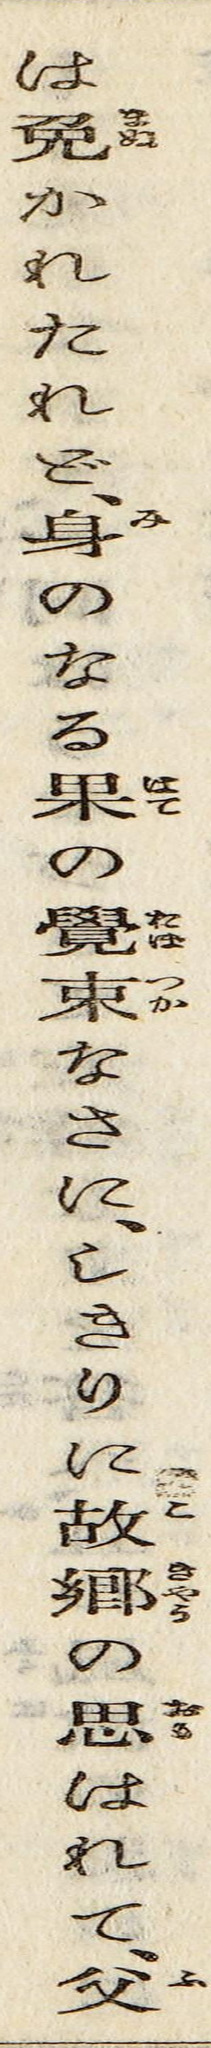は免かれたれど、身のなる果の覚束なさに、しきりに故郷の思はれて、父
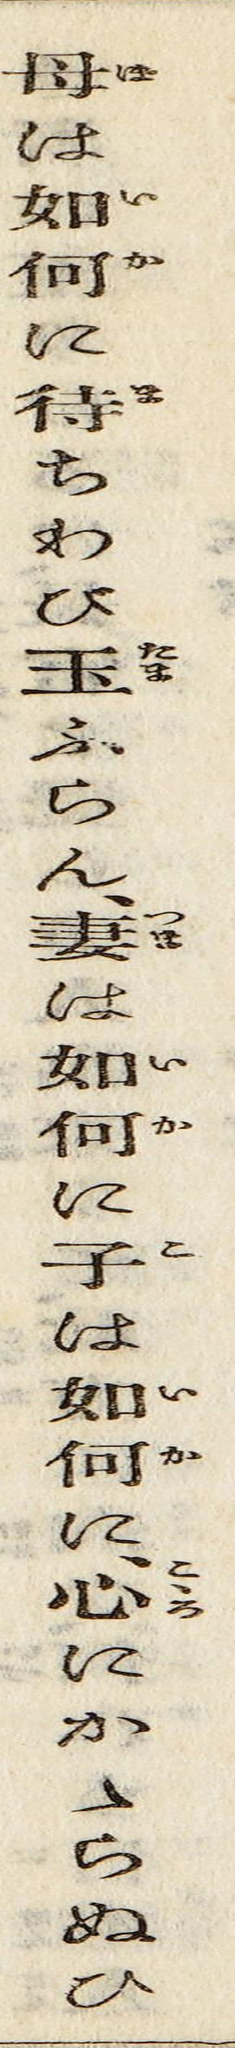母は如何に待ちわび玉ふらん、妻は如何に子は如何に、心にかゝらぬひ
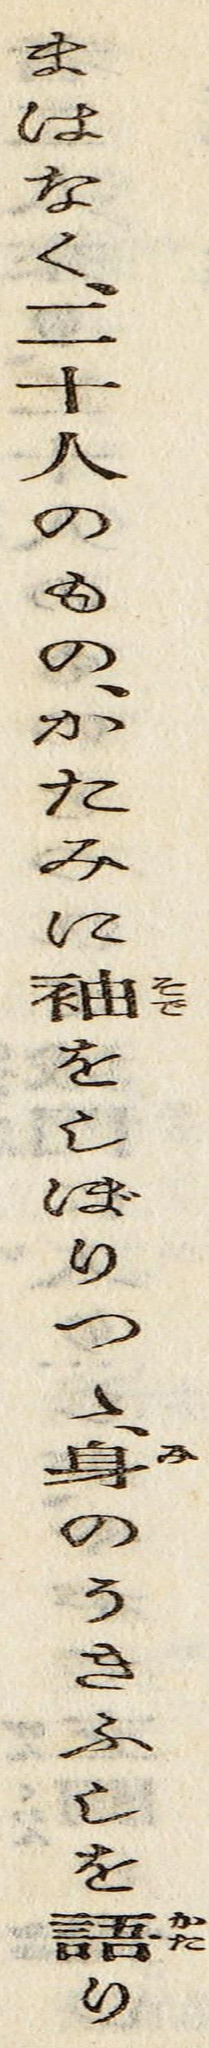まはなく、二十人のもの、かたみに袖をしぼりつゝ、身のうきふしを語り
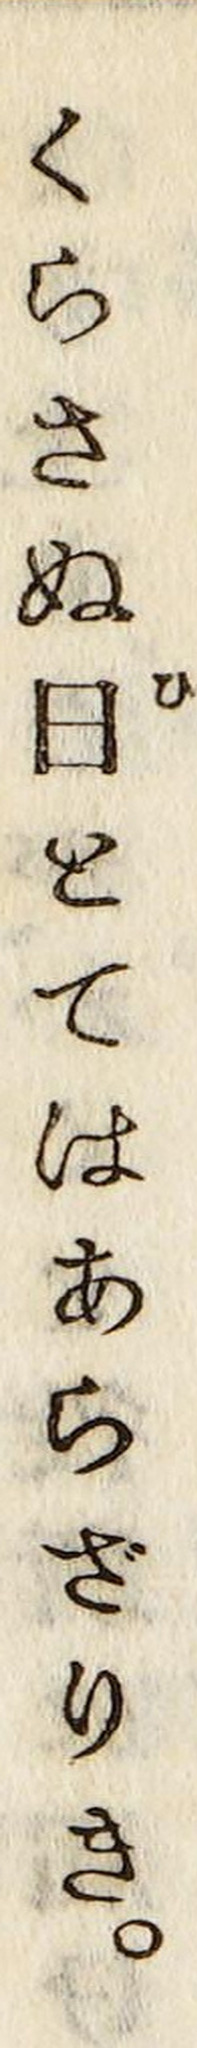くらさぬ日とてはあらざりき。
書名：日本漂流譚
